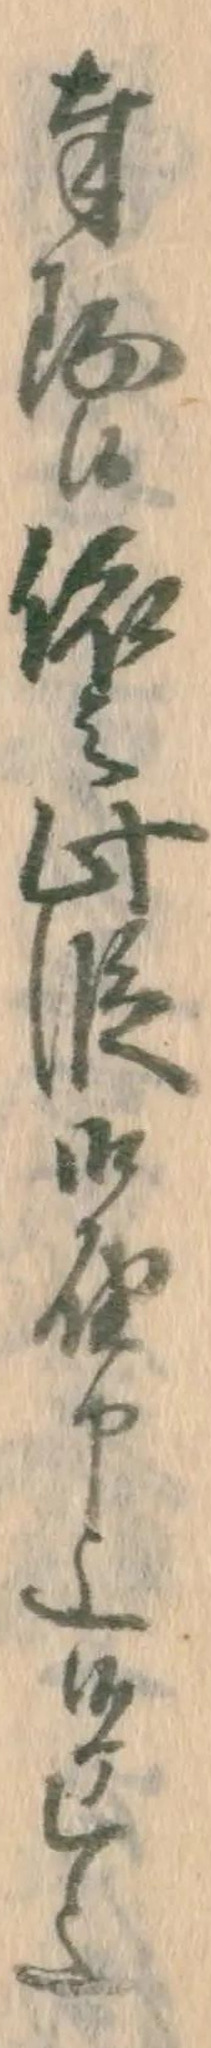奉存候依之此段御届申上候已上
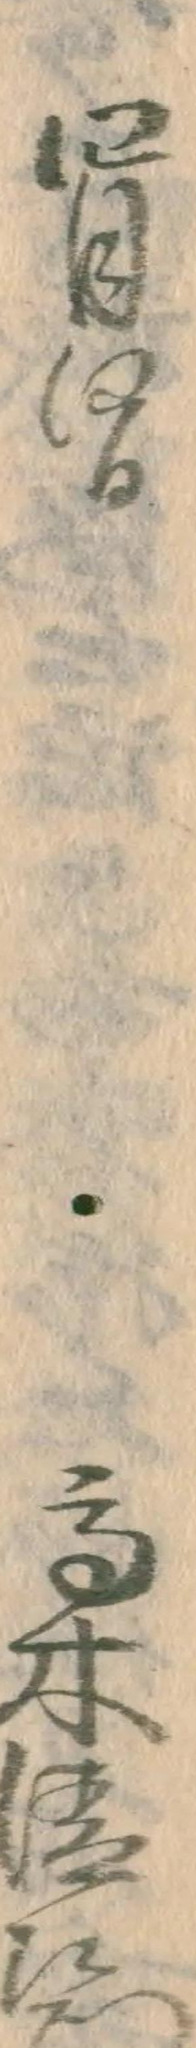四月四日高木清左衛門
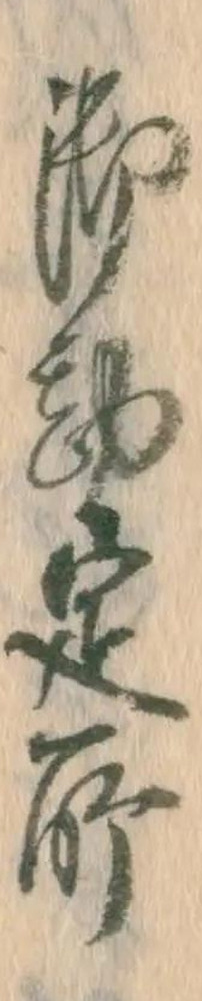御勘定所
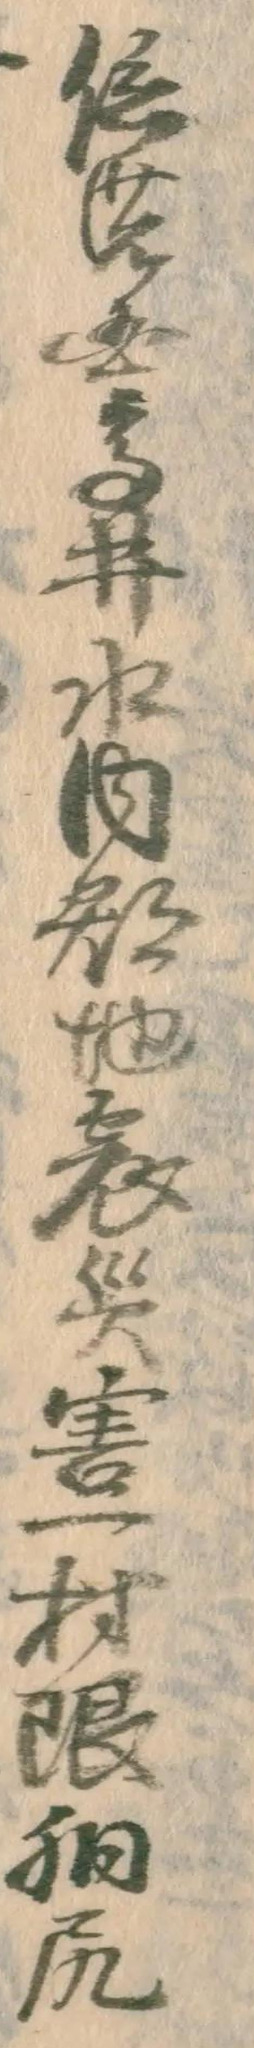信濃国高井水内郡地震災害一村限調尻
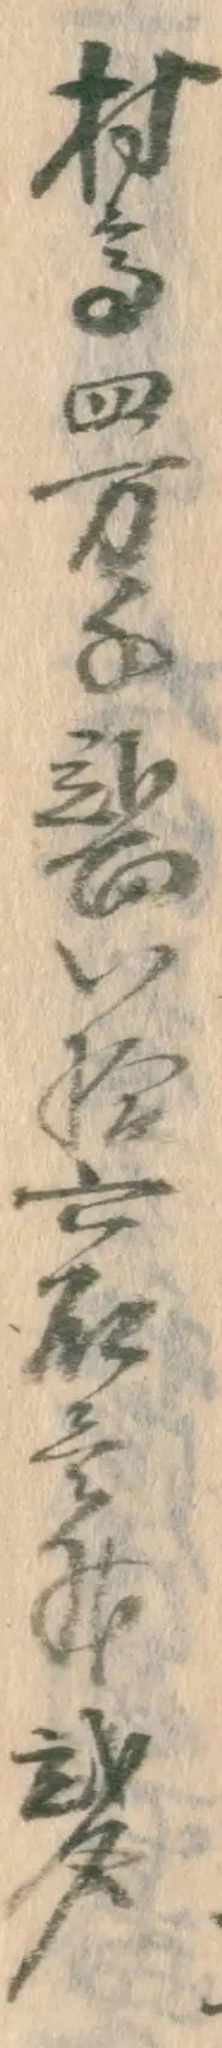村高四万千弐百八拾六石壱升弐勺
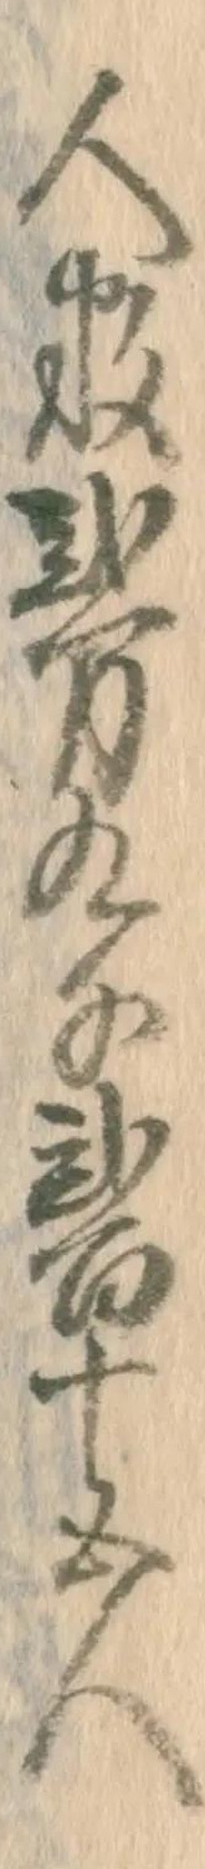人数弐万九千弐百十五人
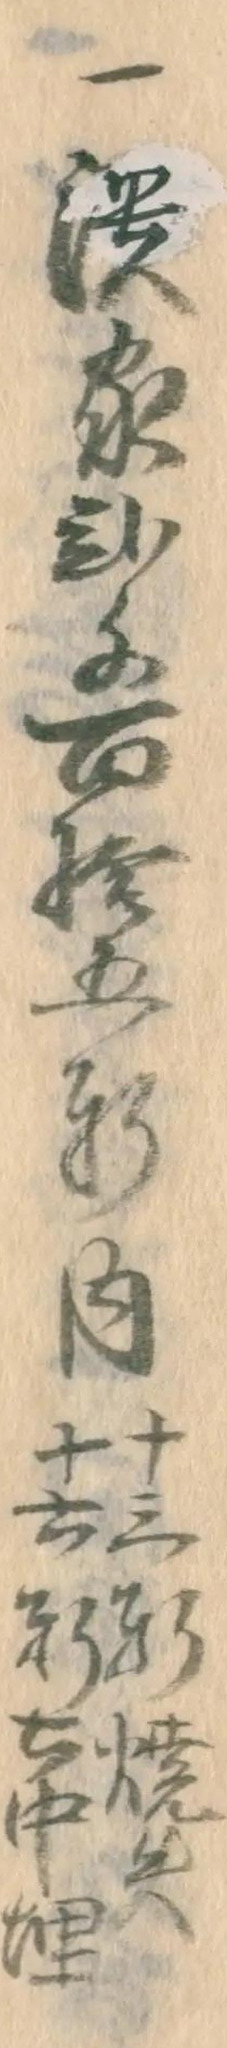一潰家弐千百拾五軒内十三軒焼失
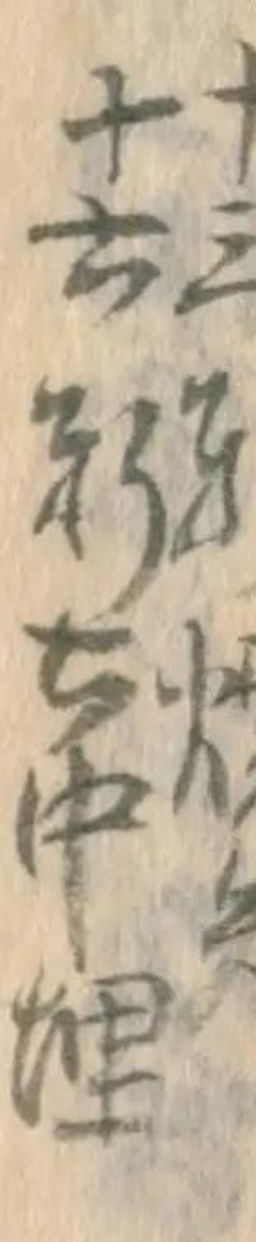十六軒土中埋
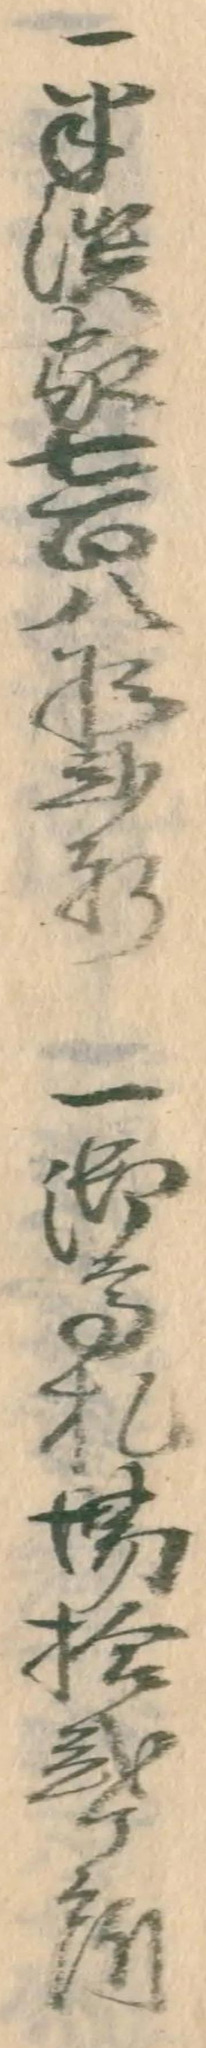一半潰家七百八拾弐軒一御高札場拾弐ヶ所

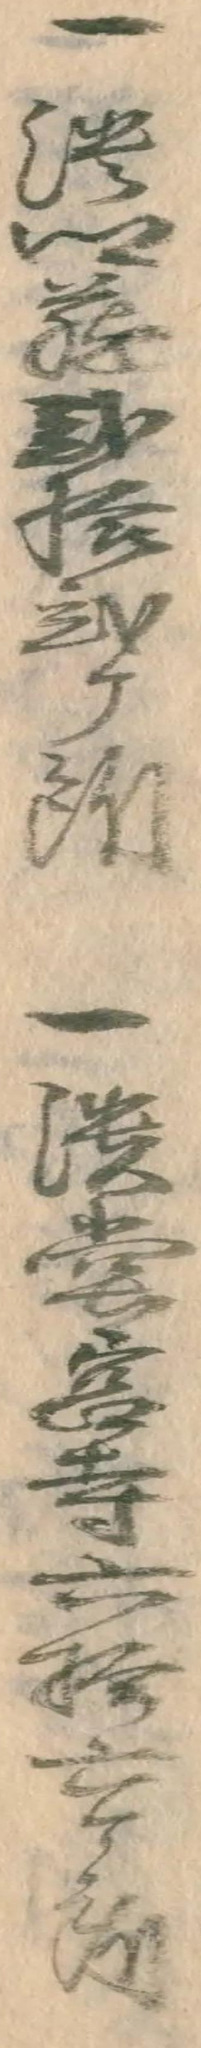一潰郷蔵弐拾弐ヶ所一潰堂宮寺六拾六ヶ所
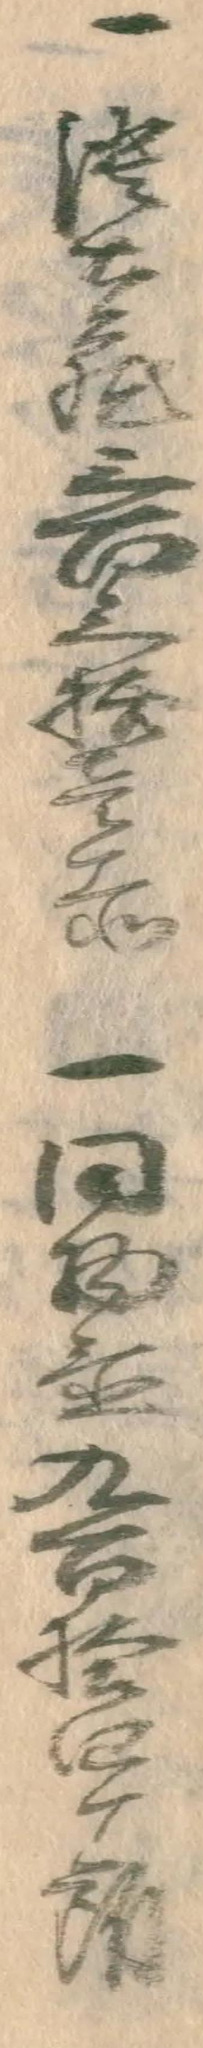一潰土蔵三百三拾壱ヶ所一同物置九百拾四ヶ所
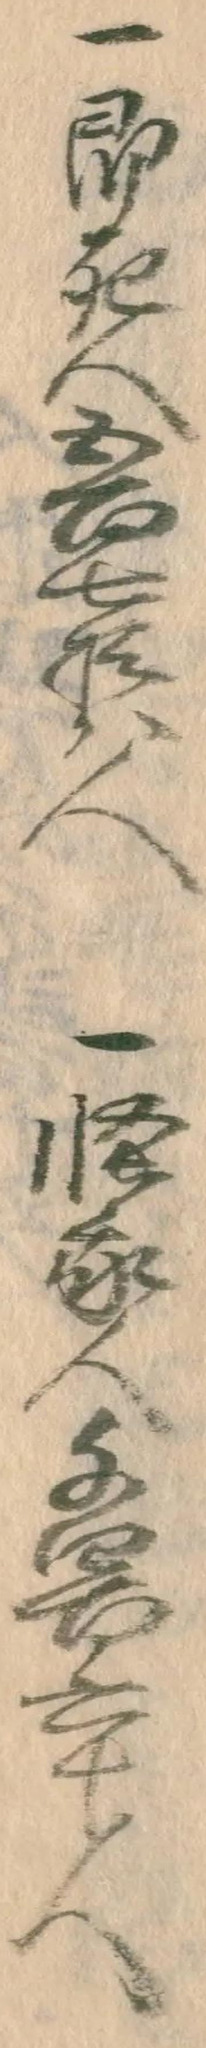一即死人五百七拾八人一怪我人千四百六十人
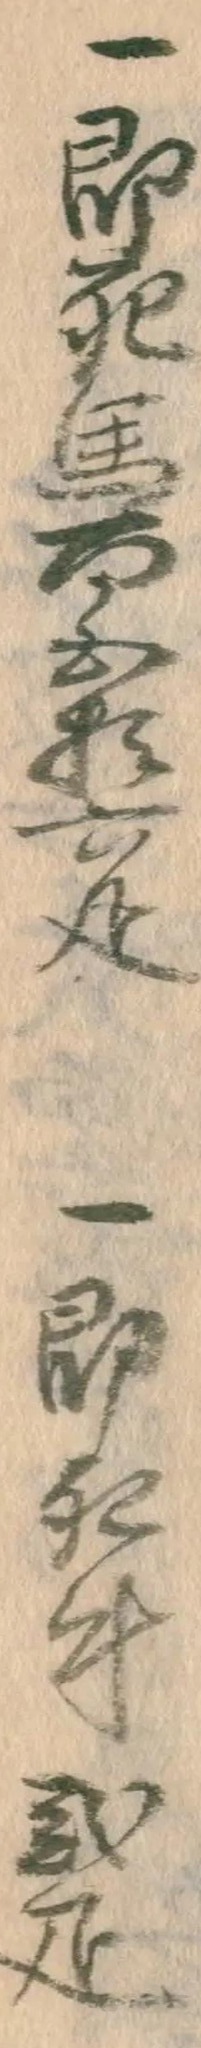一即死馬百五拾六疋一即死牛弐疋
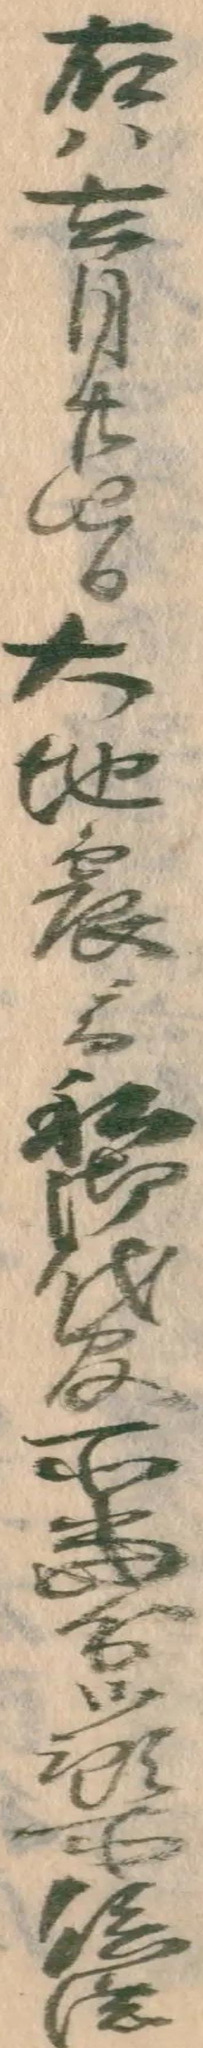右は去月廿四日大地震ニ而私御代官所当分御預所信濃
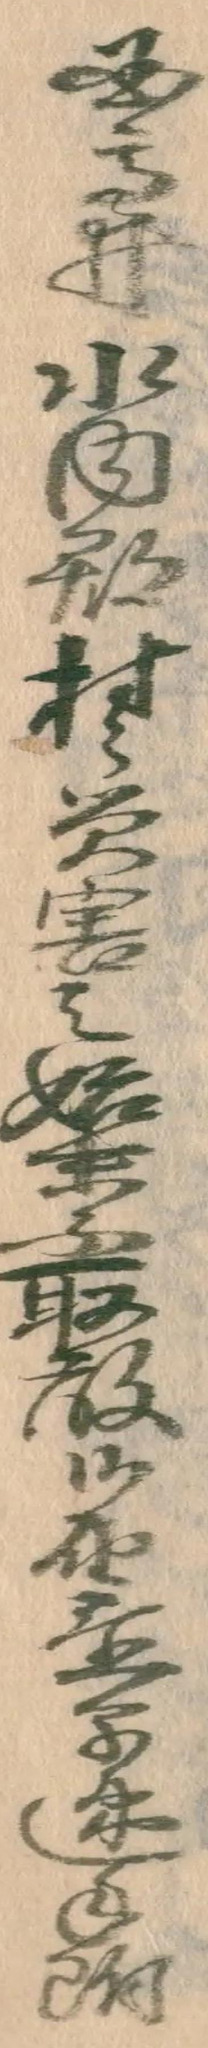国高井水内郡村々災害之始末不取敢御届置早速手附
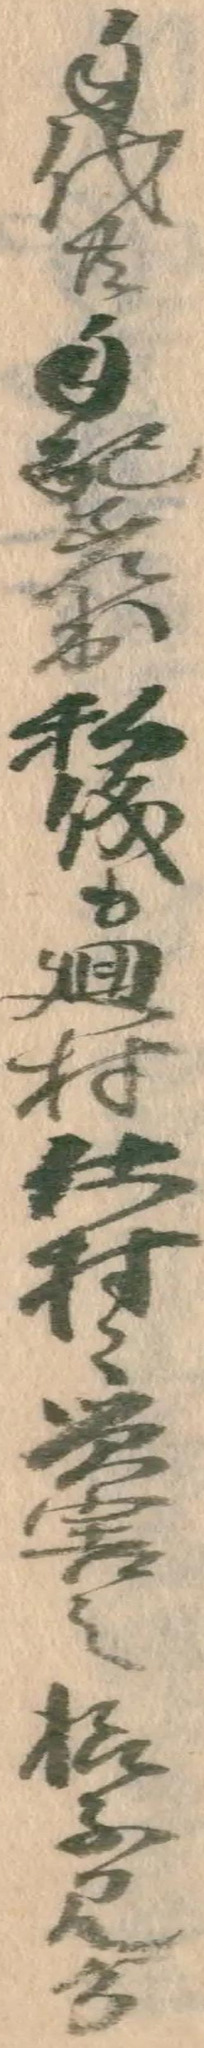手代共手配差出私儀も廻村仕村々災害之様子見分
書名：信州大地震之記
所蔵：国立国会図書館 National Diet Library, JAPAN
